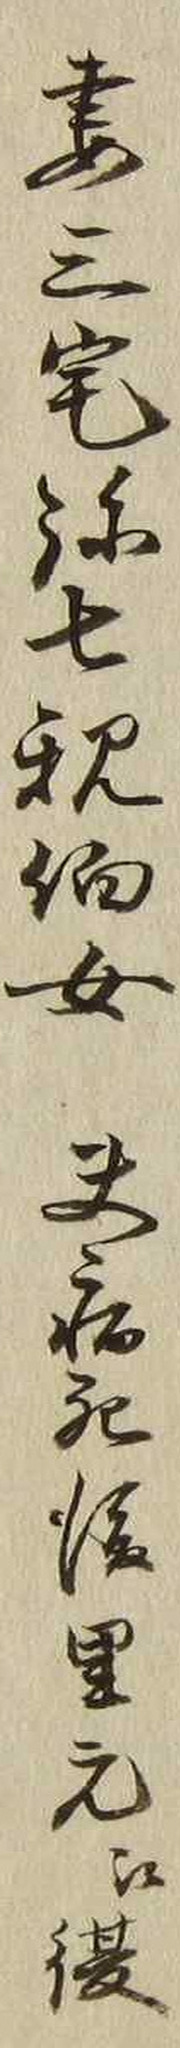妻三宅弥七親伯女夫病死後里元江復
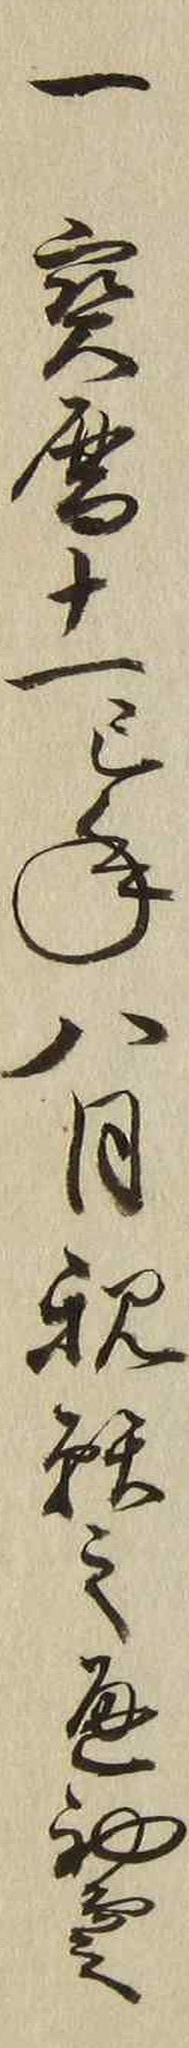一宝暦十一巳年八月親願之通初而之
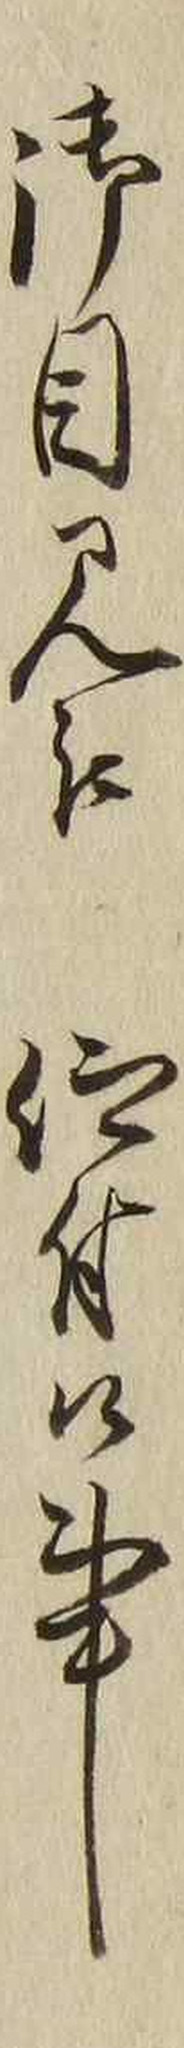御目見被仰付候事
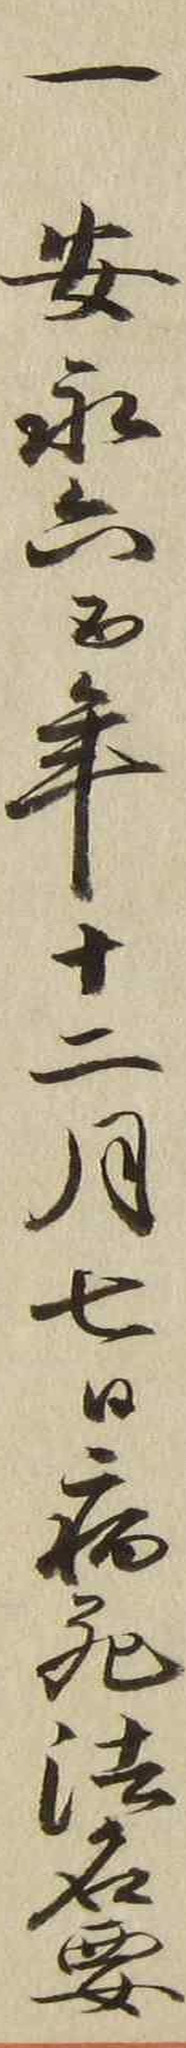一安永六酉年十二月七日病死法名要

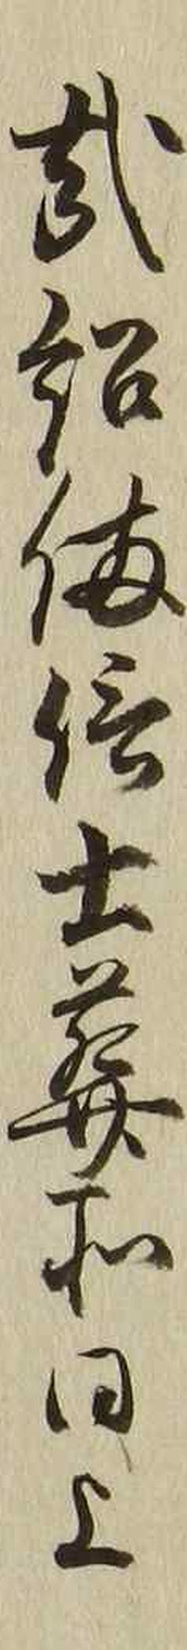哉紹備信士葬所同上
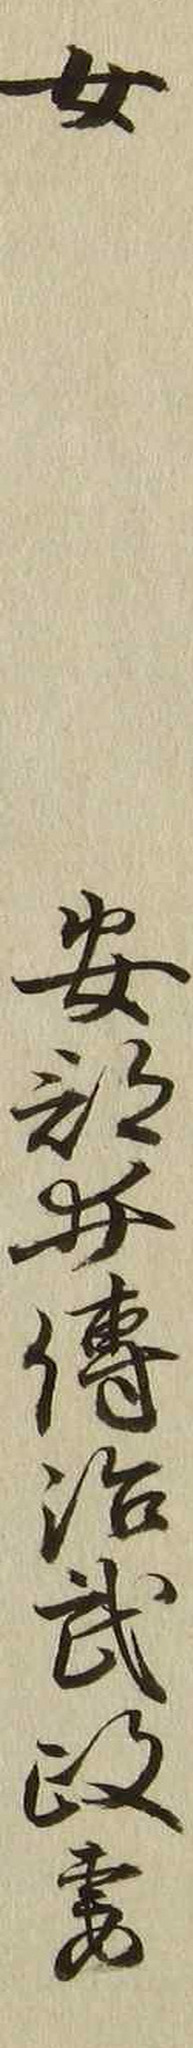女安部井伝治武政妻
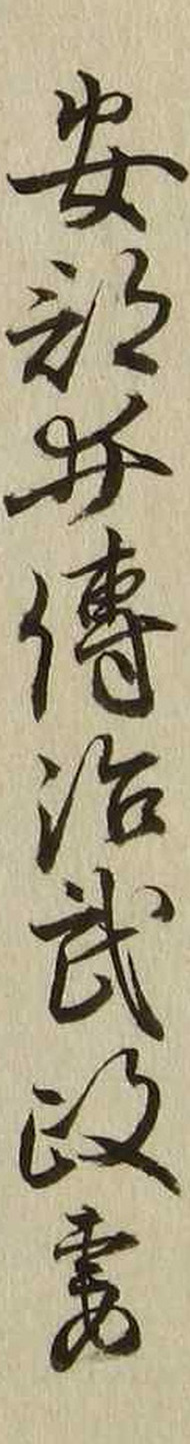女安部井伝治武政妻
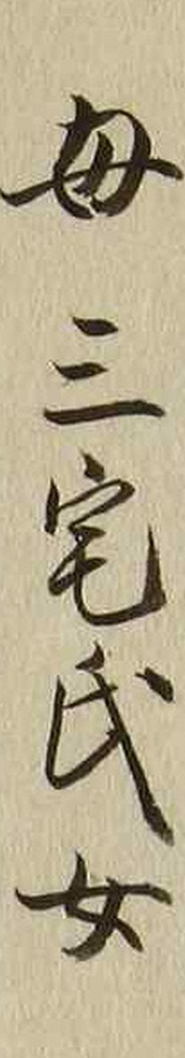母三宅氏女
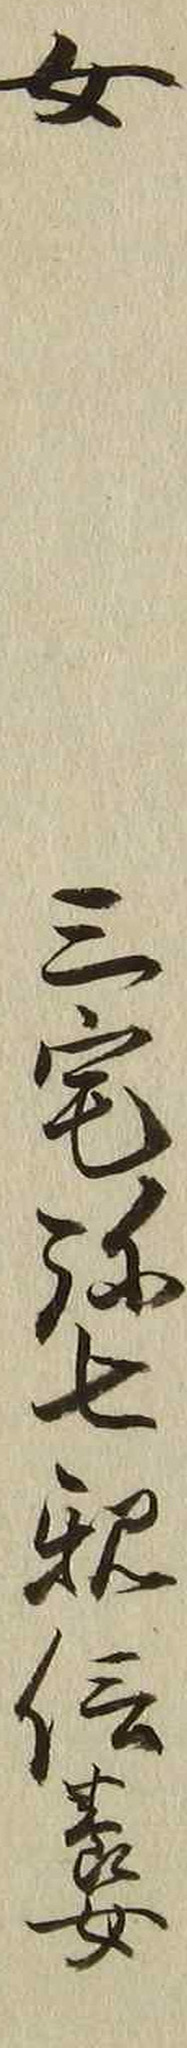女三宅弥七親信養女
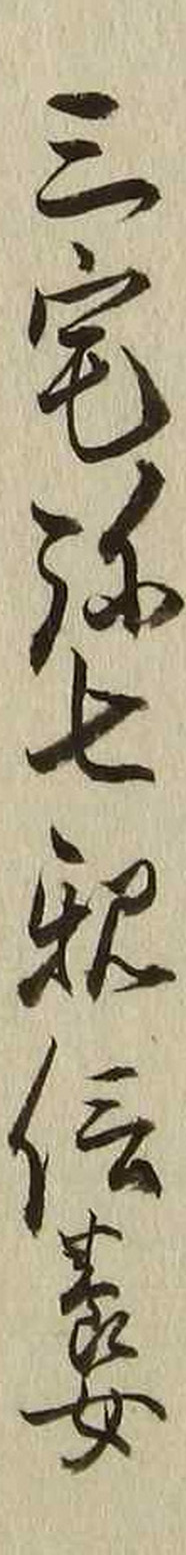女三宅弥七親信養女
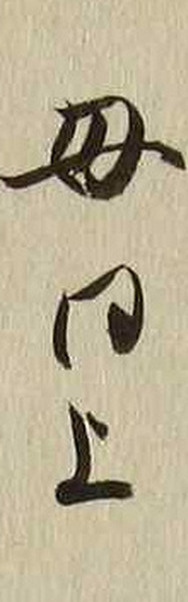母同上
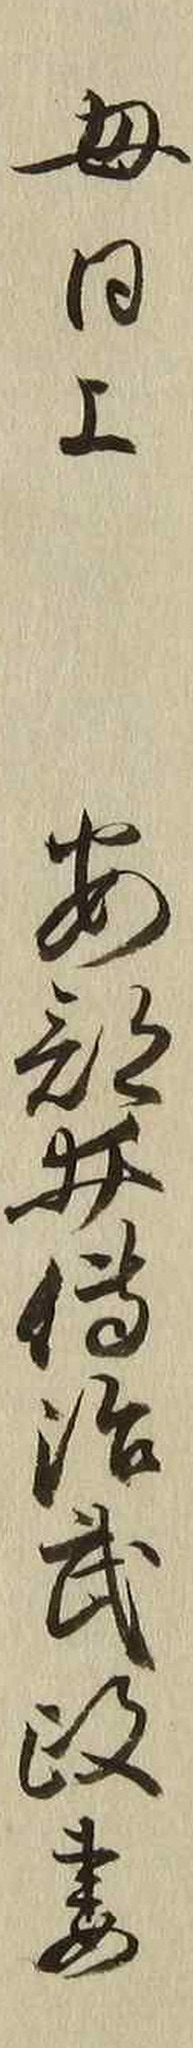母同上安部井伝治武政妻
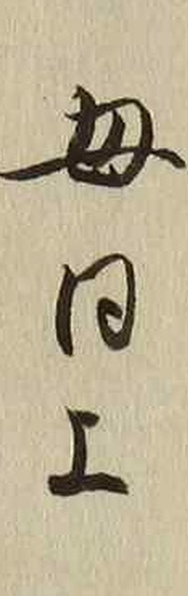母同上
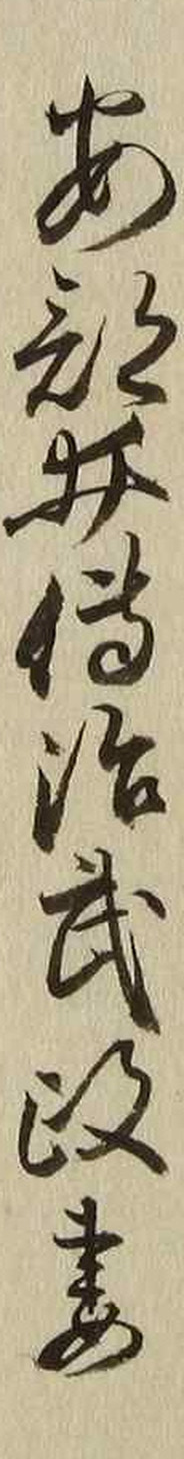女安部井伝治武政妻
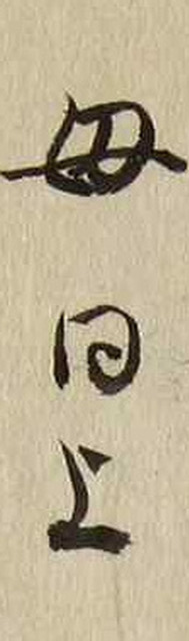母同上
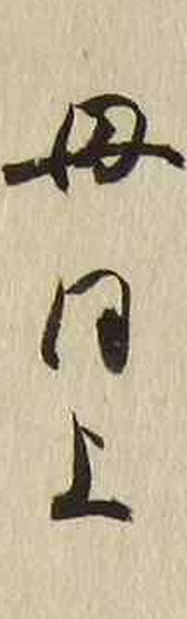母同上
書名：諸士系譜　巻之60　と之部3
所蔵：会津若松市立会津図書館
